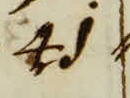41
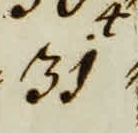31
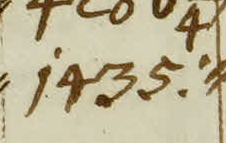1435.
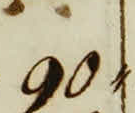90
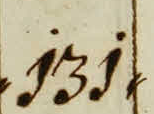131
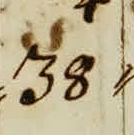38
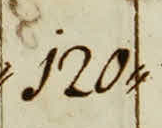120
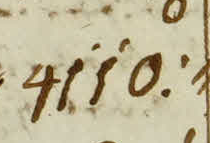4110.
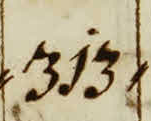313
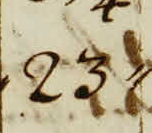23
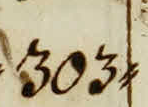303
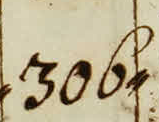306
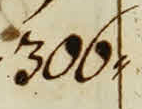306
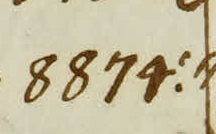8874:
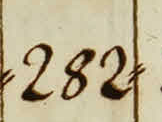282
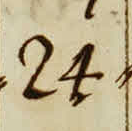24
